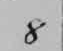8
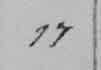17
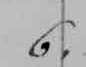6
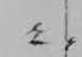2
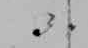3
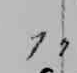1
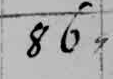86
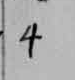4
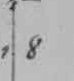8
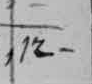12
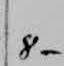8
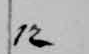12
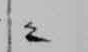2
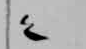2
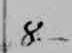8.
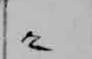2
